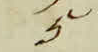5
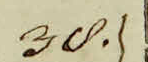38.
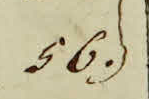56.
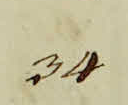34
